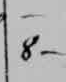8
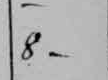8
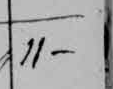11
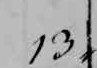13
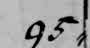95
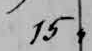15
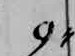9
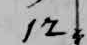12
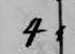4
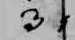3
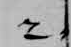2
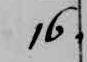16
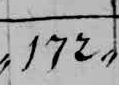172
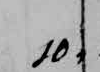10
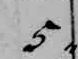5
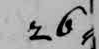26
